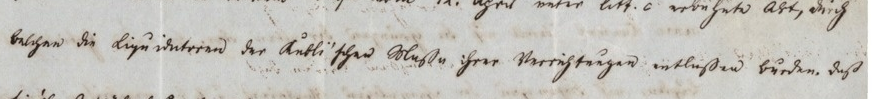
welchen die Liquidatoren der Kubli'schen Masse ihrer Verrichtungen entlassen wurden. Daß
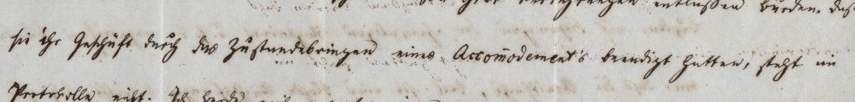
sie ihr Geschäft durch das Zustandebringen eines Accommodement's beendigt hatten, steht im
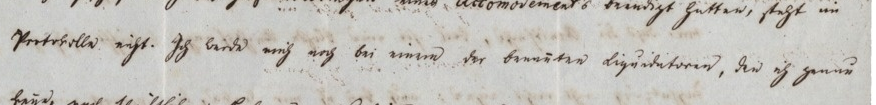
Protokolle nicht. Ich werde mich noch bei einem der benannten Liquidatoren, den ich genau
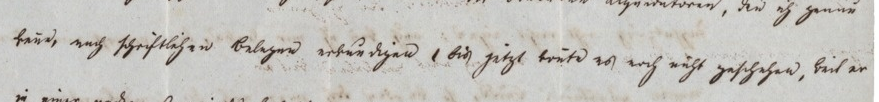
kenne, nach schriftlichen Belegen erkundigen (bis jetzt konnte es noch nicht geschehen, weil er
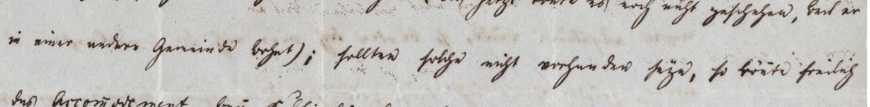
in einer andern Gemeinde wohnt); sollten solche nicht vorhanden seyn, so könnte freilich
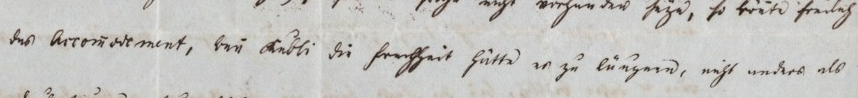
das Accommodement, wenn Kubli die Frechheit hätte es zu läugnen, nicht anders als
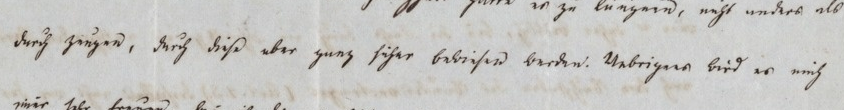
durch Zeugen, durch diese aber ganz sicher bewiesen werden. Uebrigens wird es mich
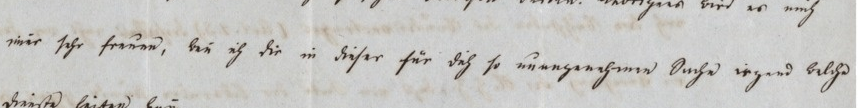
immer sehr freuen, wenn ich dir in dieser für dich so unangenehmen Sache irgend welche
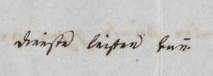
Dienste leisten kann.
